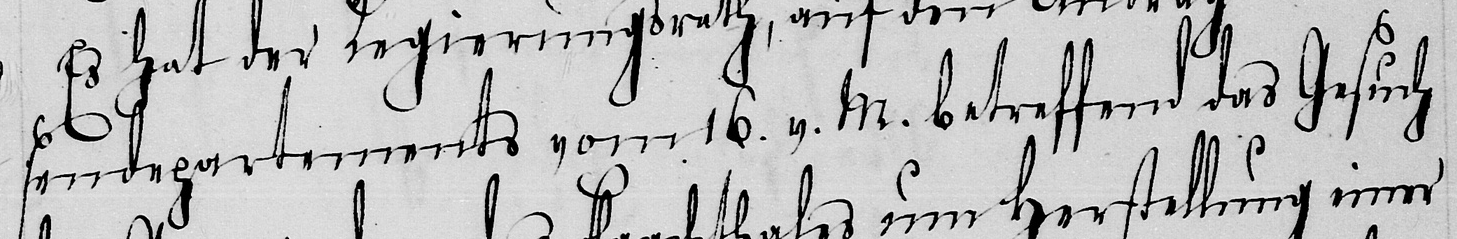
endepartements vom 16. v. M. betreffend das Gesuch
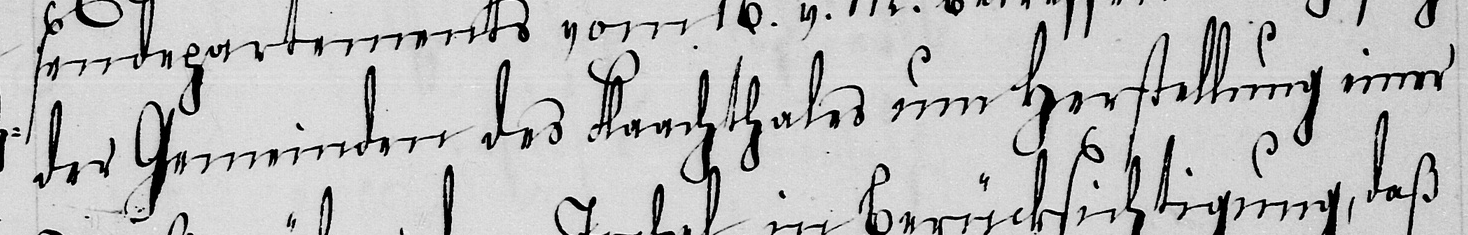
der Gemeinden des Flachthales um Herstellung einer
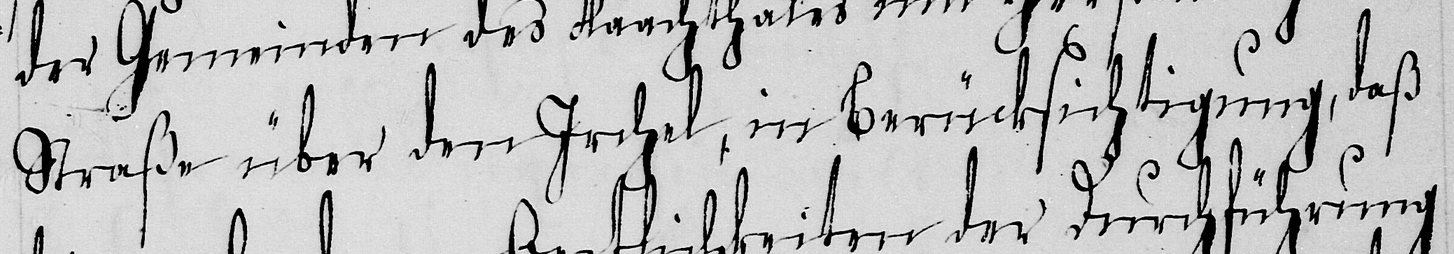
Straße über den Irchel, in Berücksichtigung, daß
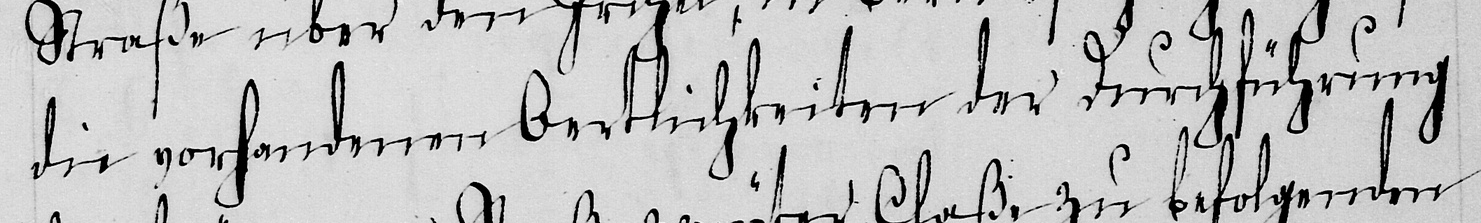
die vorhandenen Oertlichkeiten der Durchführung
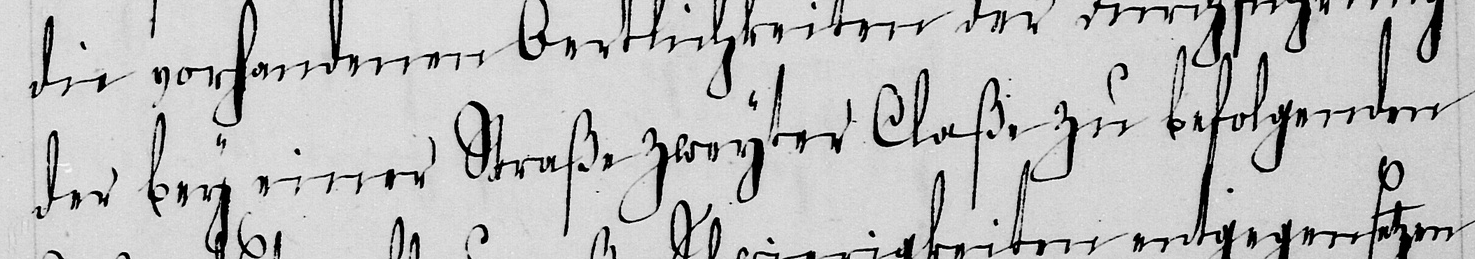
der bey einer Straße zweyter Claße zu befolgenden
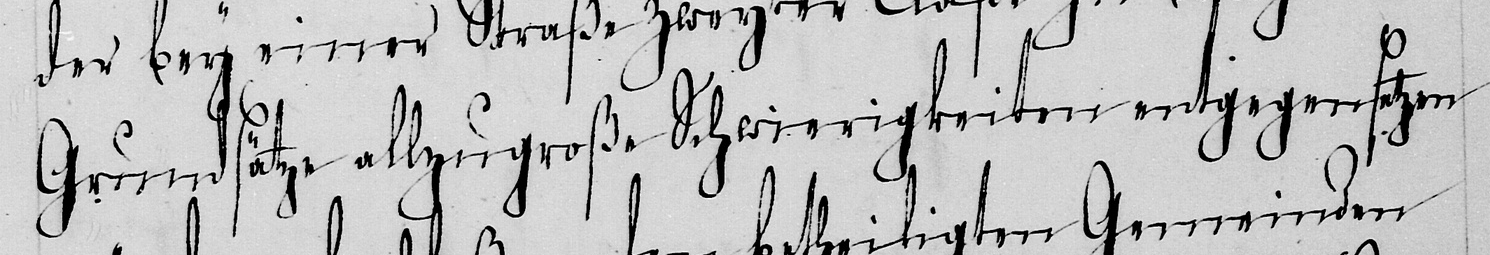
Grundsätze allzugroße Schwierigkeiten entgegensetzen
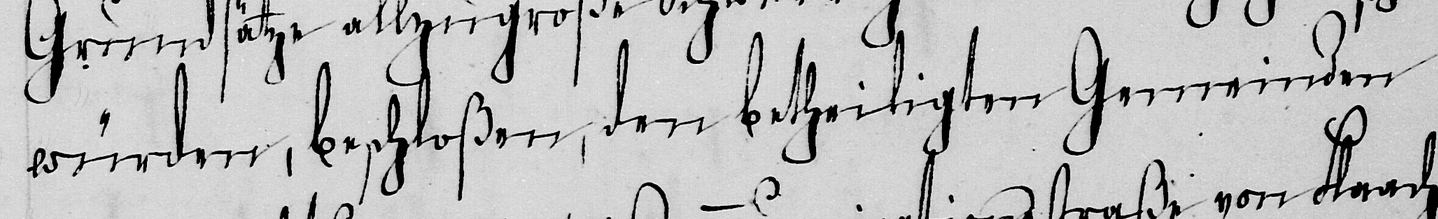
würden, beschloßen, den betheiligten Gemeinden
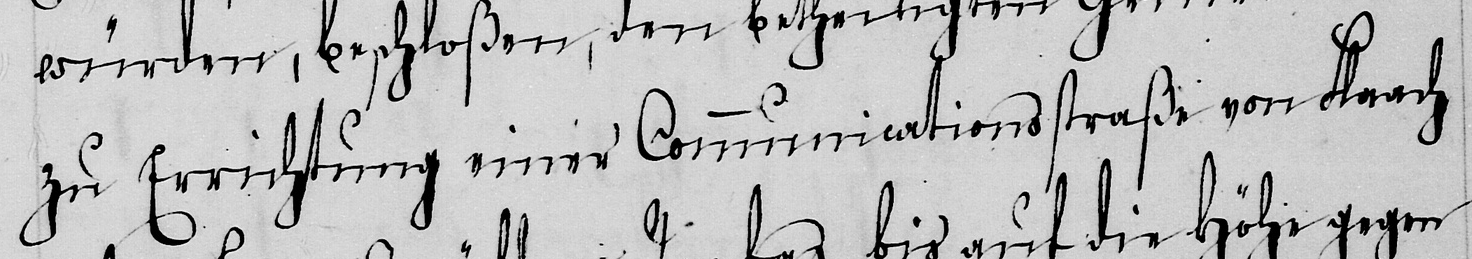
zu Errichtung einer Communicationsstraße von Flaach
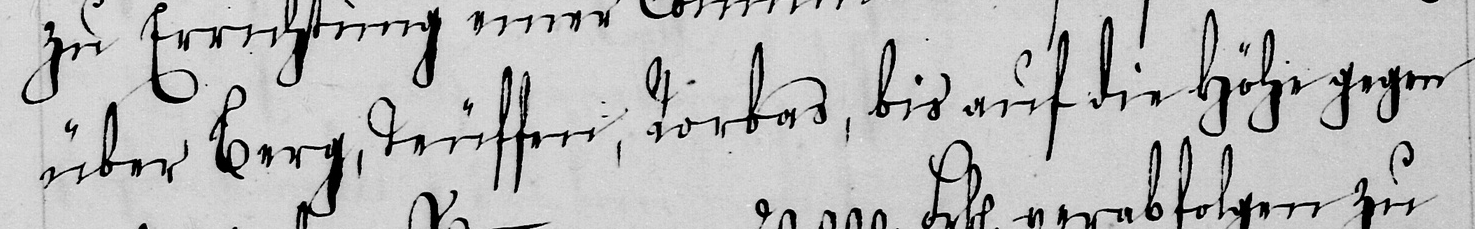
über Berg, Trüffen, Rorbas, bis auf die Höhe gegen
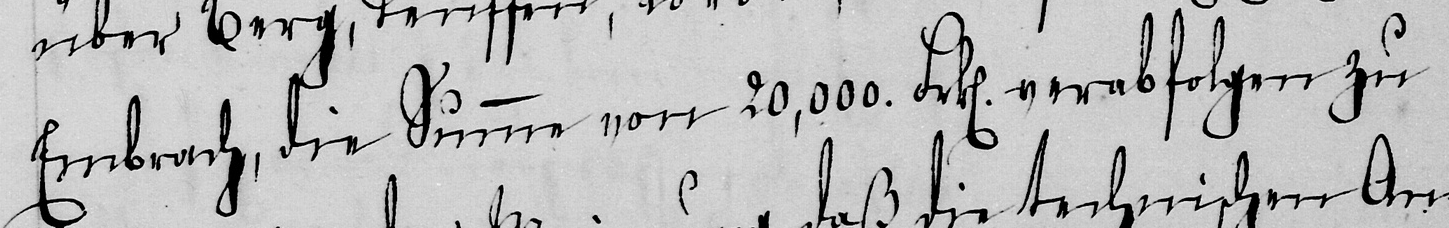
Embrach, die Summe von 20'000 Frk[en]. verabfolgen zu
